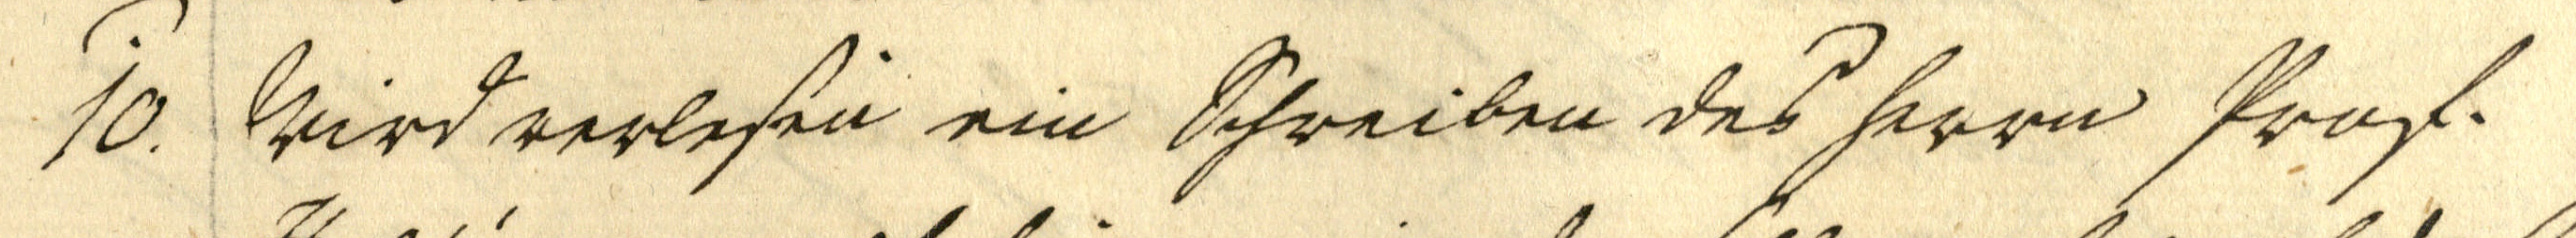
10. Wird verlesen ein Schreiben des Herrn Prof.
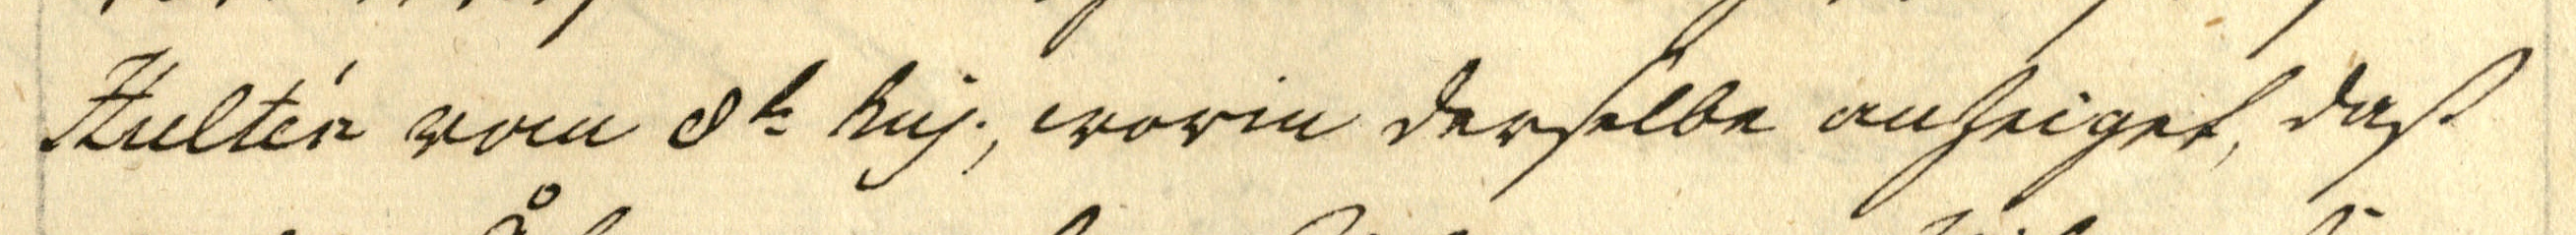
Hultén vom 8 t huj., worin derselbe anzeiget, daß
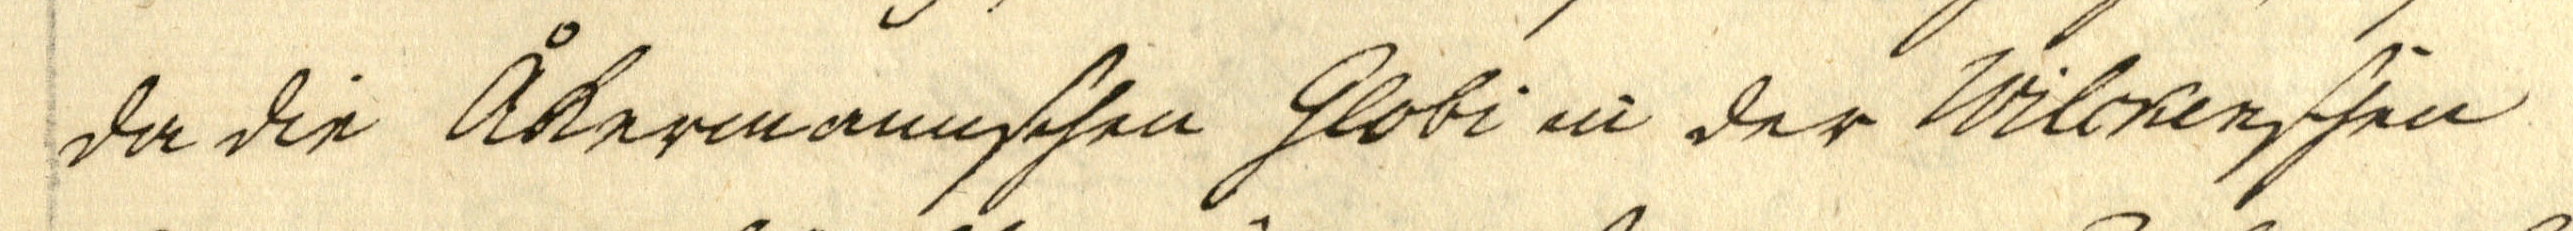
da die Åkermannschen Globi in der Wilckenschen
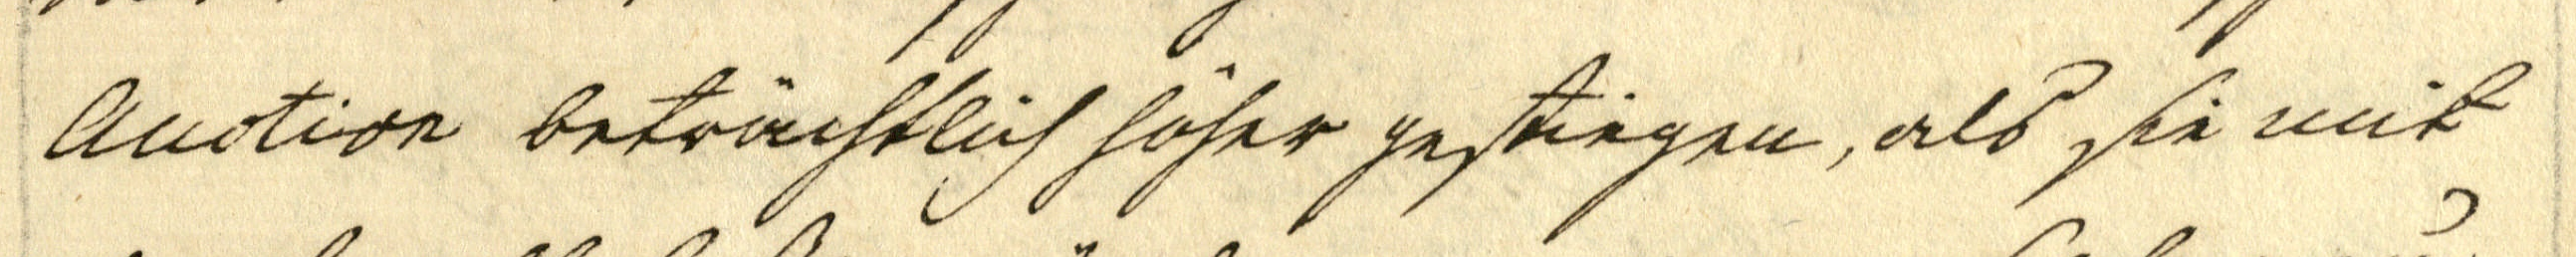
Auction beträchtlich höher gestiegen, als sie mit
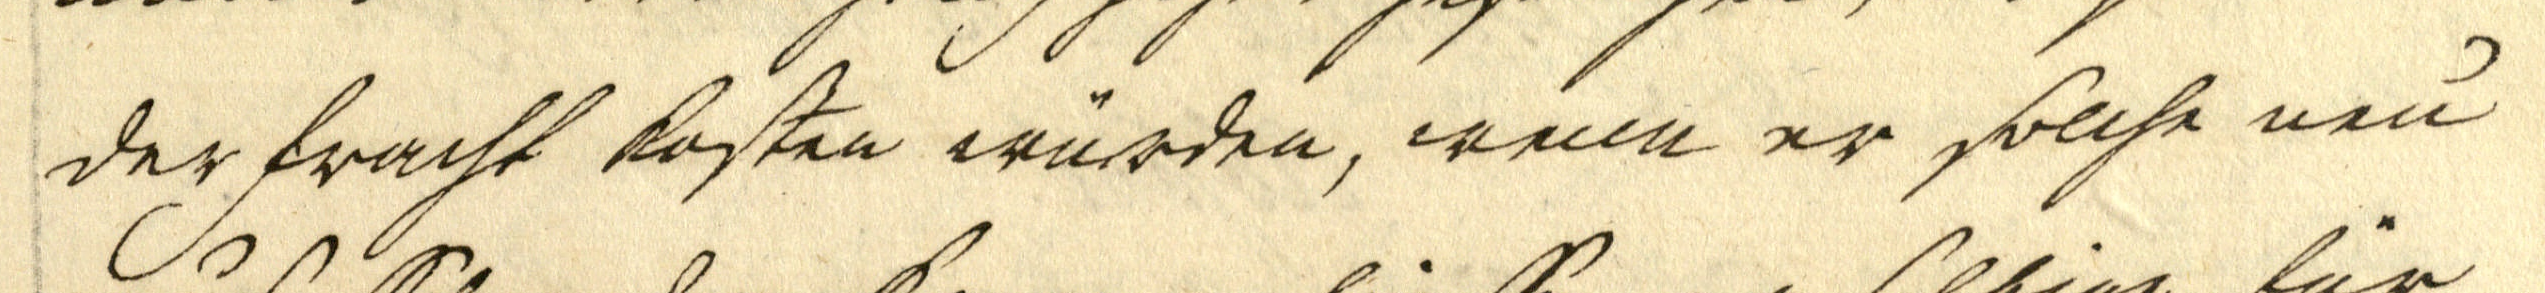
der Fracht kosten würden, wenn er solche neu
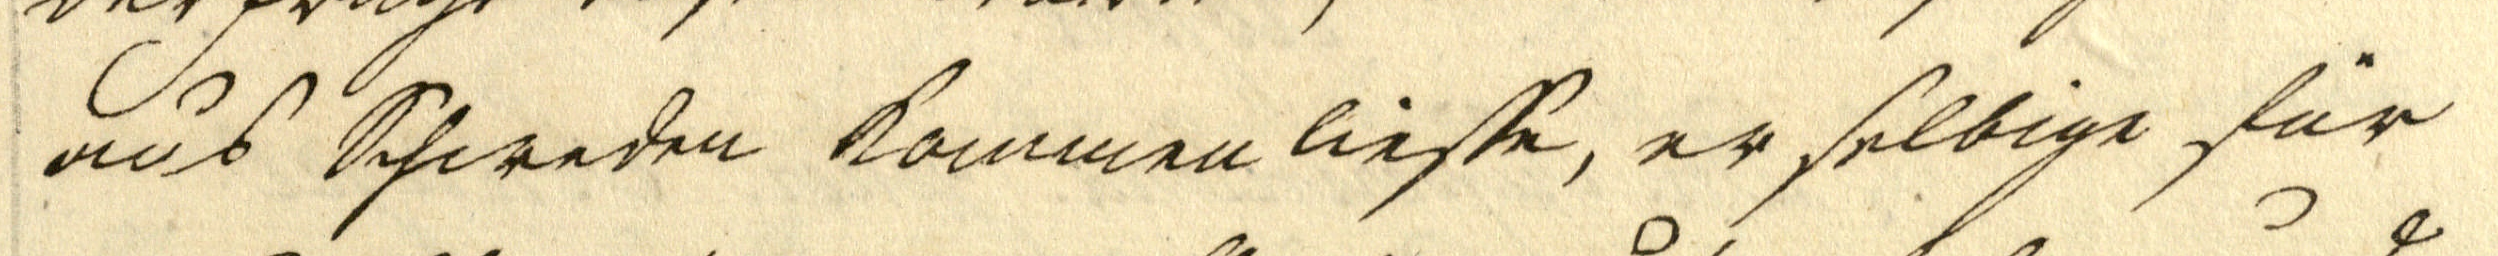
aus Schweden kommen liesse, er selbige für
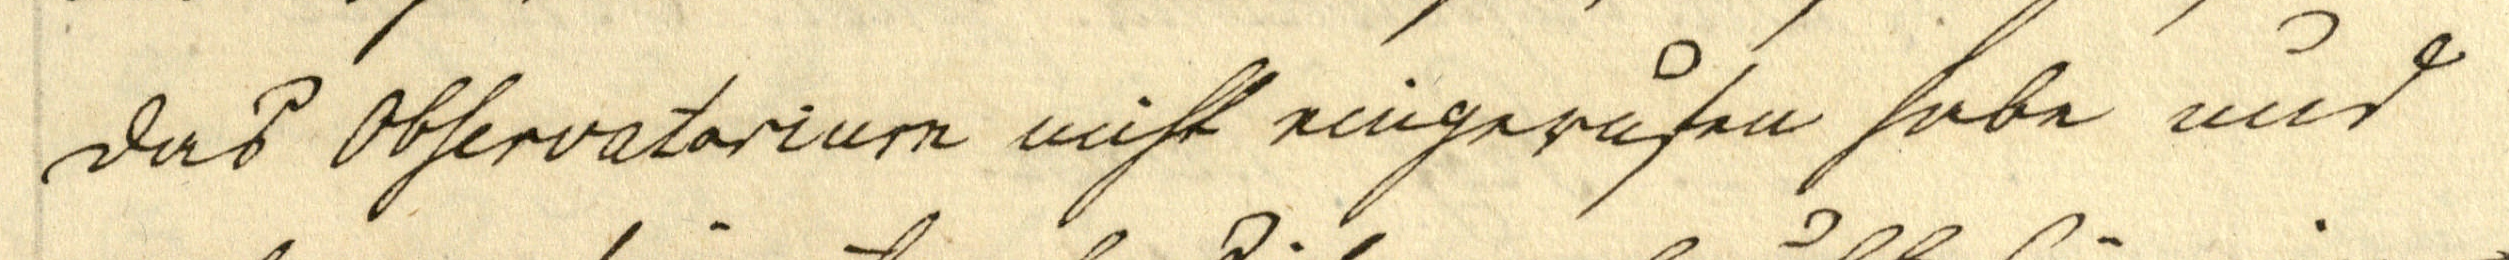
das Observatorium nicht eingerufen habe und
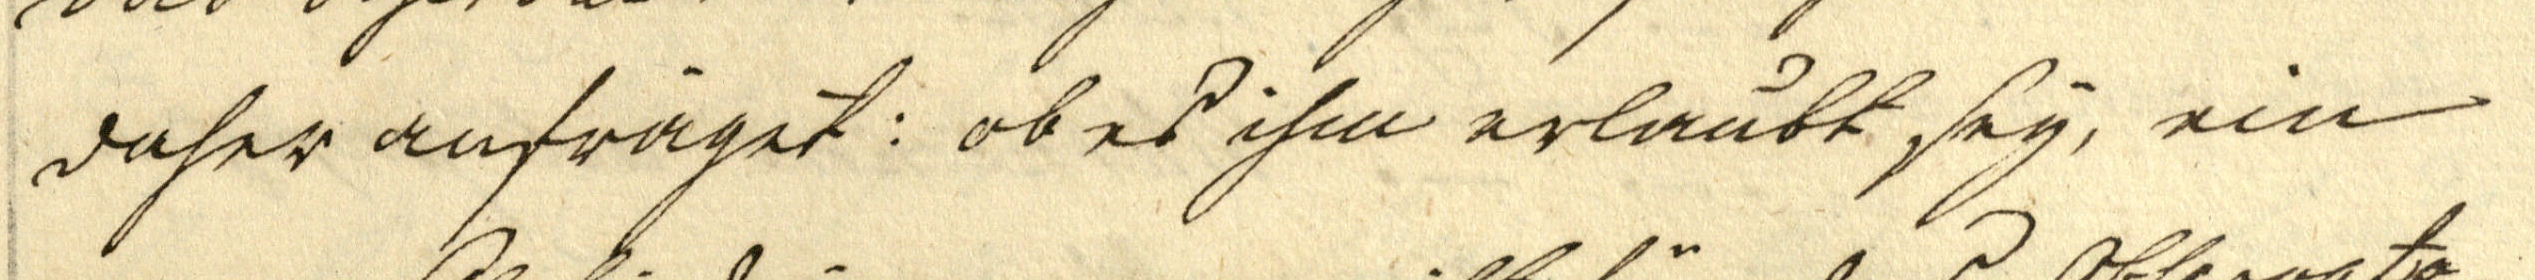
daher anfräget: ob es ihm erlaubt seÿ, ein
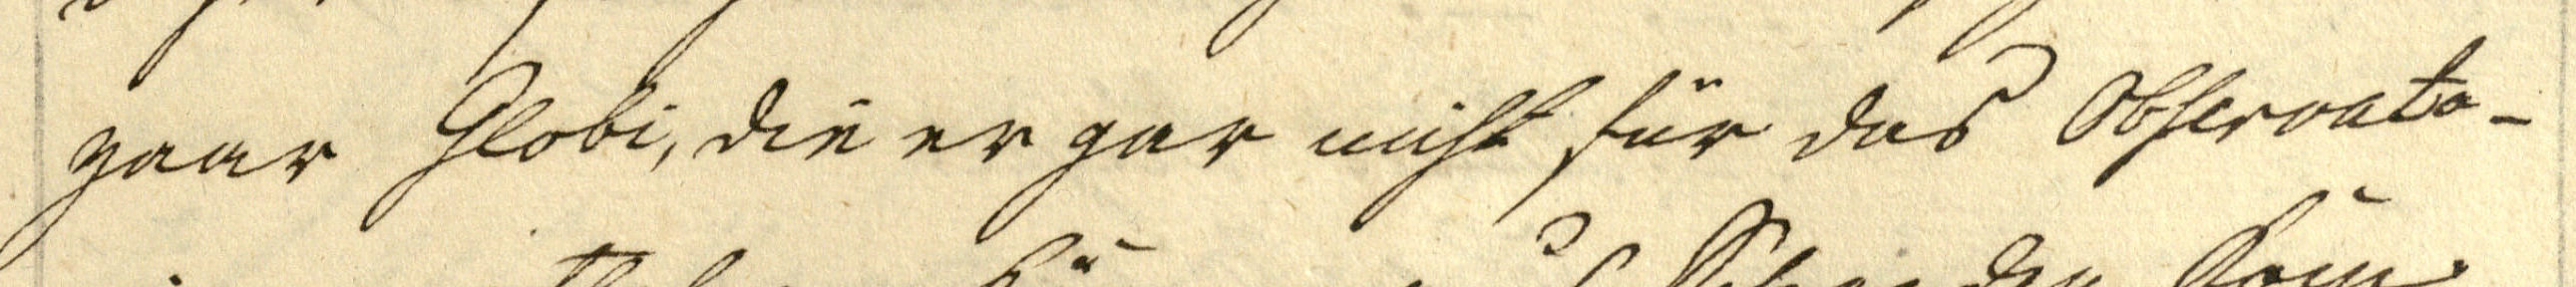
paar Globi, die er gar nicht für das Observato¬
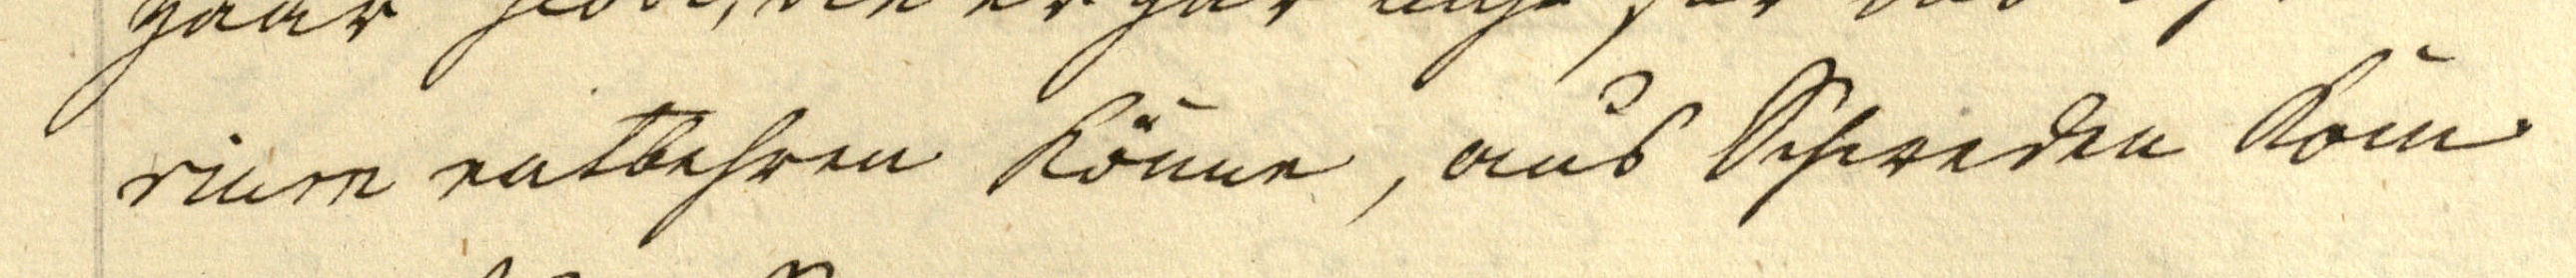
rium entbehren könne, aus Schweden kom¬
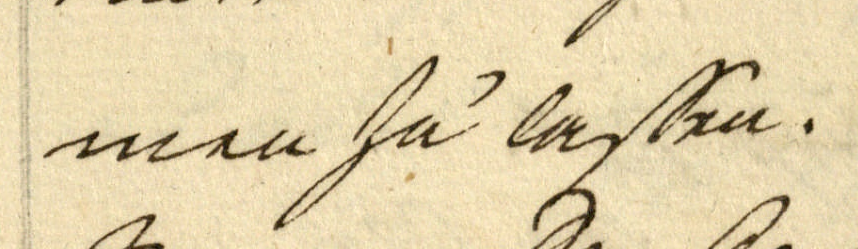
men zu lassen.
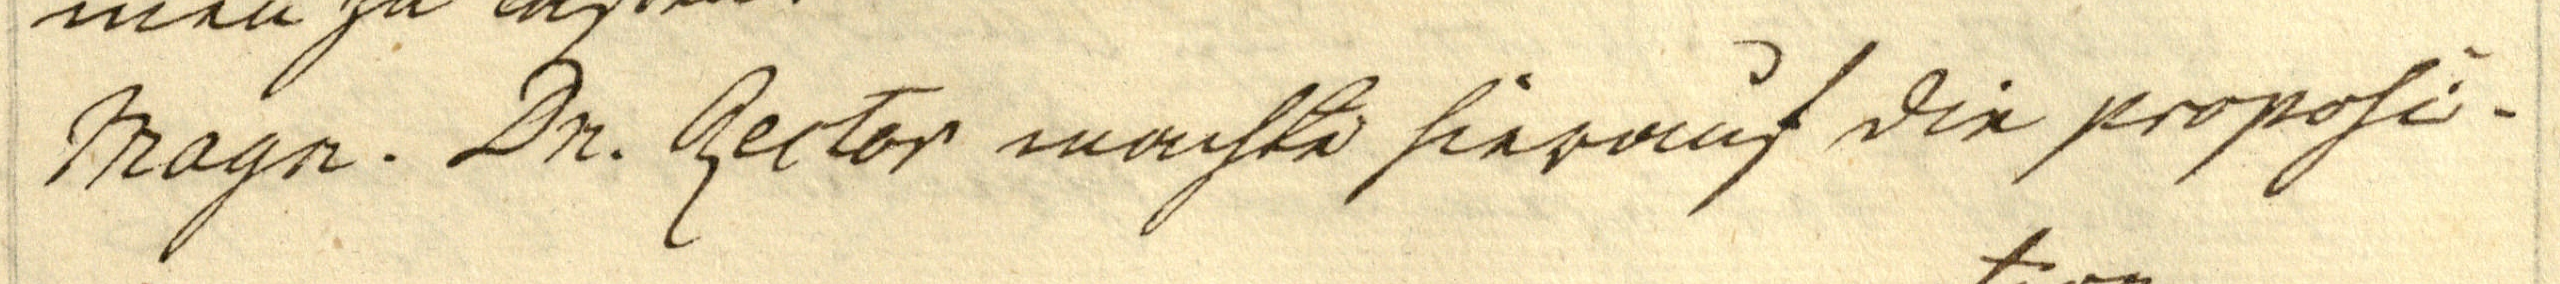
Magn. Dn. Rector machte hierauf die proposi¬
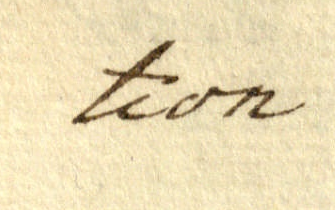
tion
